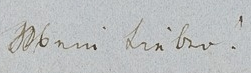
Mein Lieber!
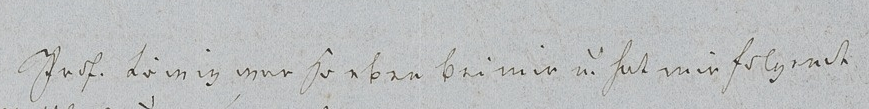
Prof. Löwig war so eben bei mir u. hat mir folgende
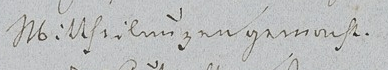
Mittheilungen gemacht.
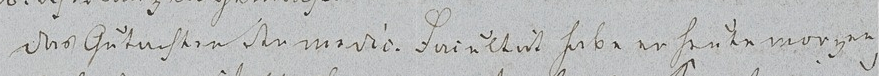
Das Gutachten der medic. Facultät habe er heute morgen
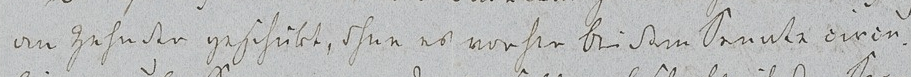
an Zehnder geschickt, ohne es vorher bei dem Senate circu-
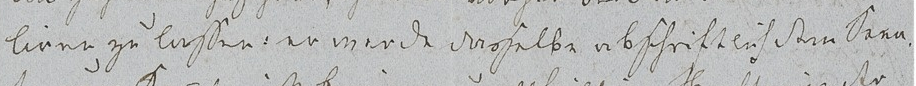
liren zu lassen: er werde dasselbe abschriftlich dem Sena-
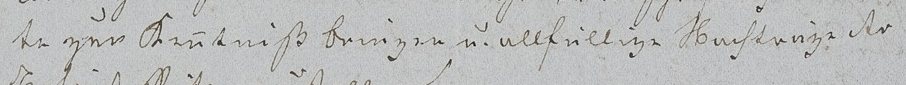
te zur Kenntniß bringen u. allfällige Nachträge der
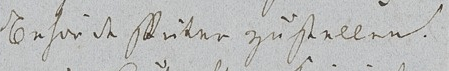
Behörde später zustellen.
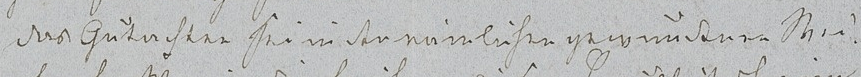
Das Gutachten sei in der nämlichen gewundenen Wei-
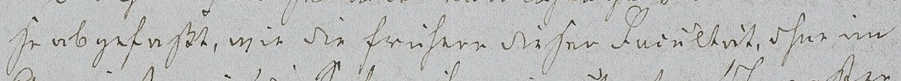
se abgefaßt, wie die frühern dieser Facultät, ohne im
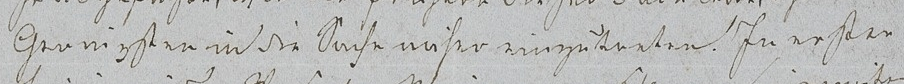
Geringsten in die Sache näher einzutreten. In erster
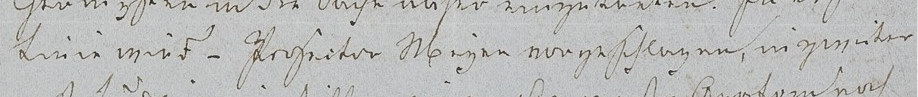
Linie wird – ProsectorMeyer vorgeschlagen, in zweiter
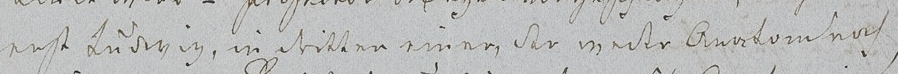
erst Ludwig, in dritter einer, der weder Anatom noch
